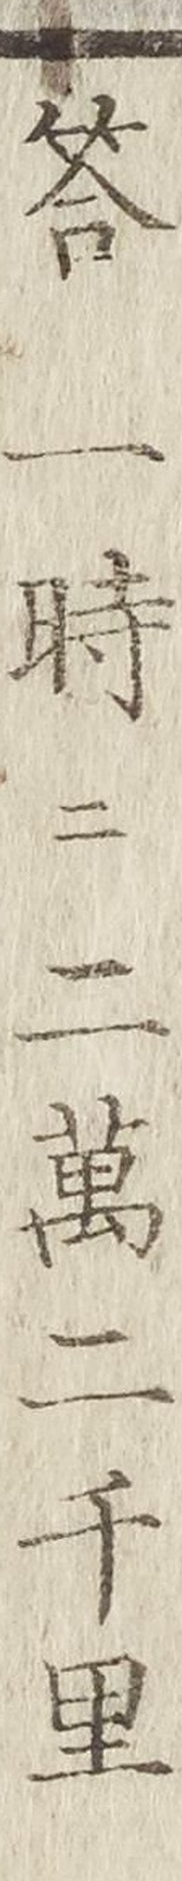答一時ニ二万二千里
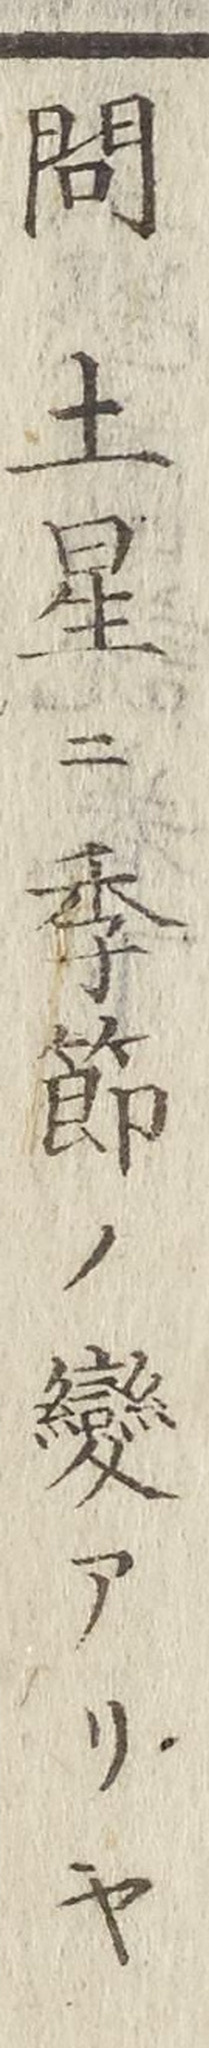問土星ニ季節ノ変アリヤ
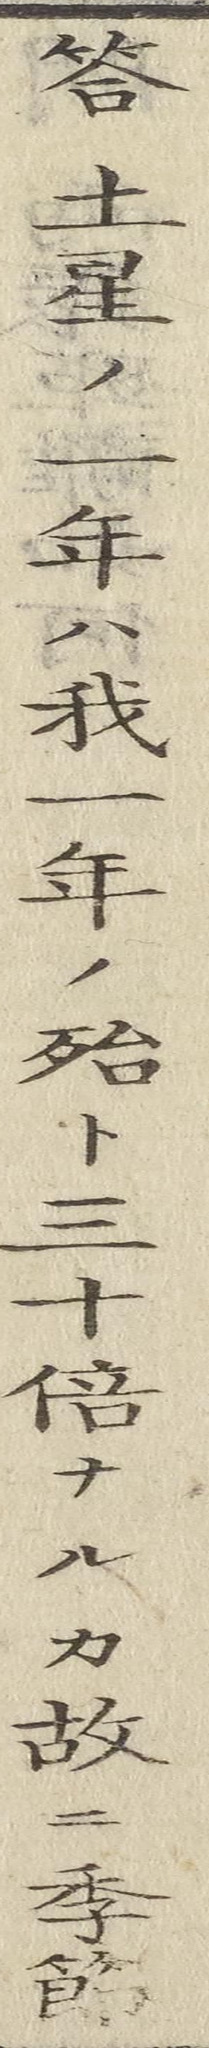答土星ノ一年ハ我一年ノ殆ト三十倍ナルカ故ニ季節
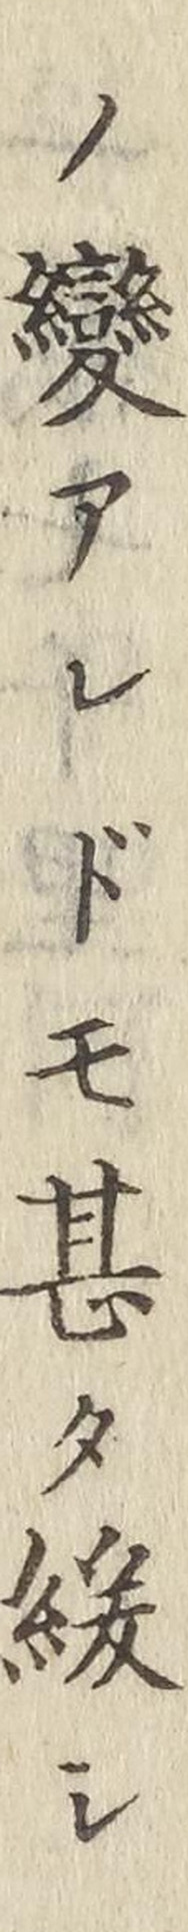ノ変アレドモ甚タ緩シ
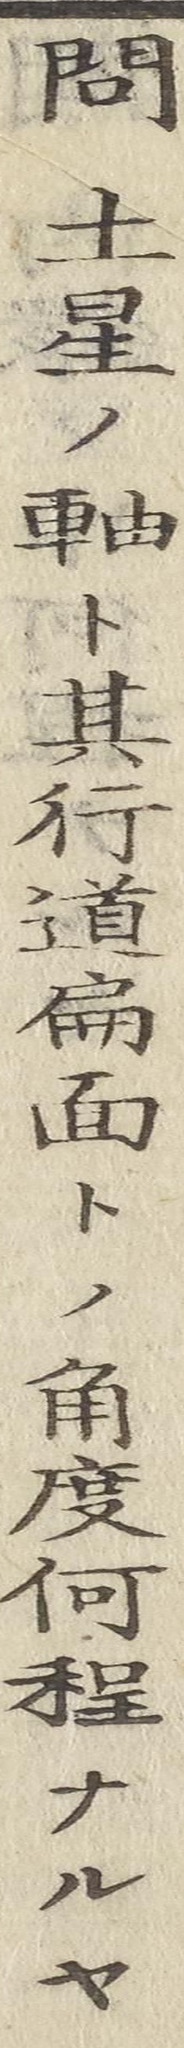問土星ノ軸ト其行道扁面トノ角度何程ナルヤ
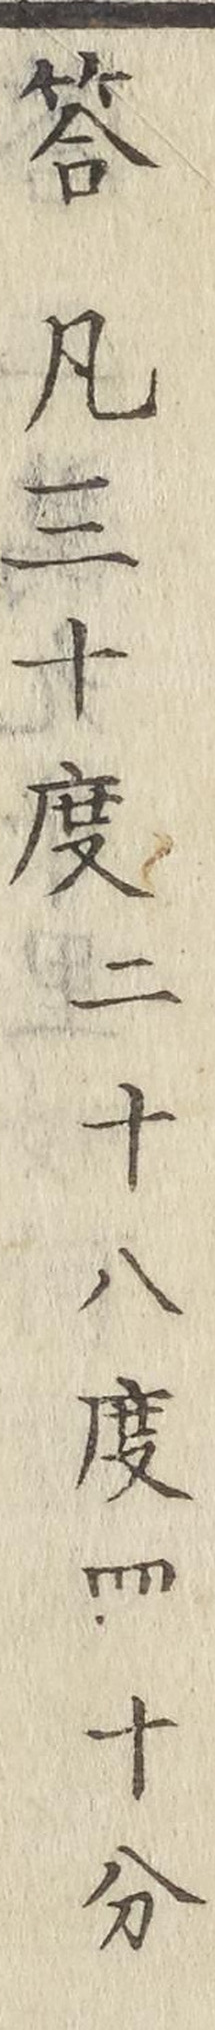答凡三十度二十八度四十分
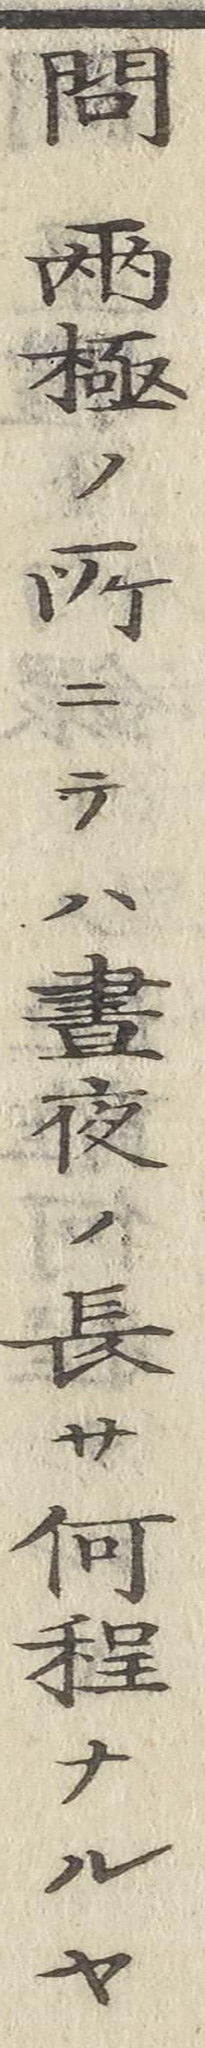問両極ノ所ニテハ昼夜ノ長サ何程ナルヤ
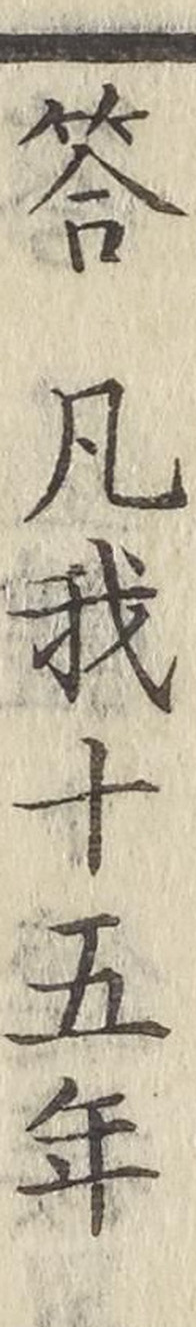答凡我十五年
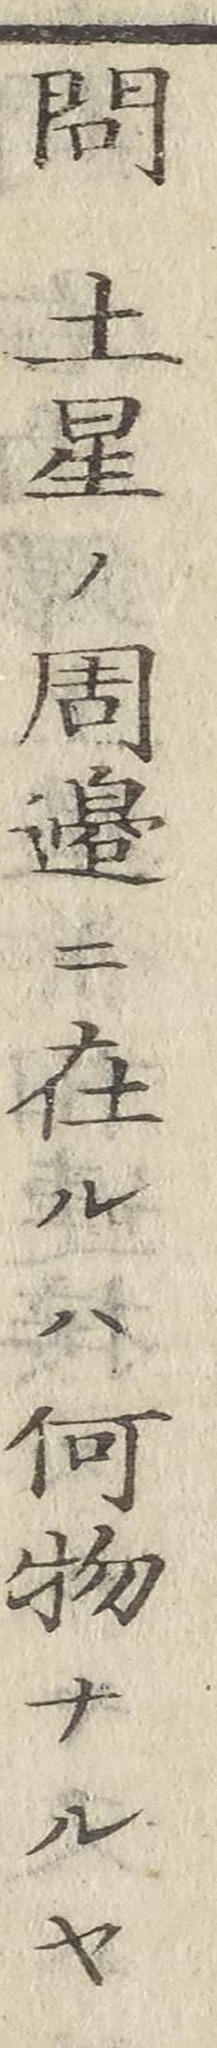問土星ノ周辺ニ在ルハ何物ナルヤ
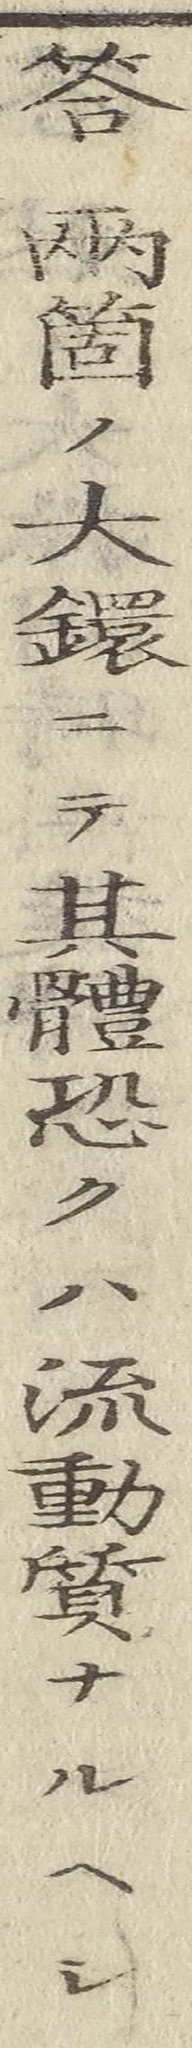答両箇ノ大鐶ニテ其体恐クハ流動質ナルヘシ
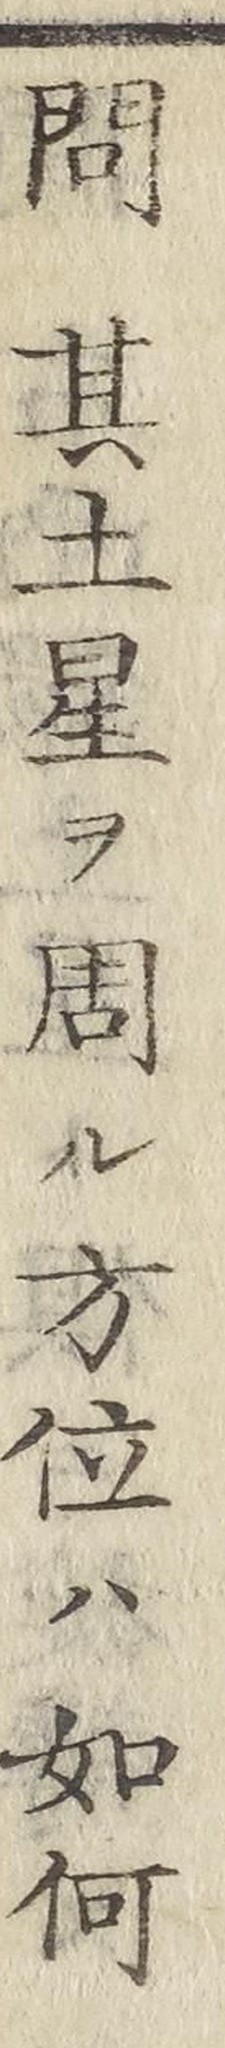問其土星ヲ周ル方位ハ如何
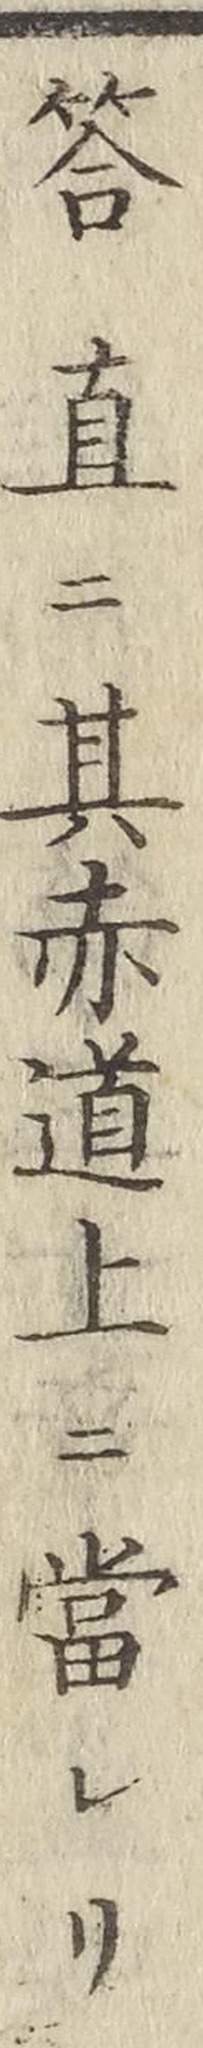答直ニ其赤道上ニ当レリ

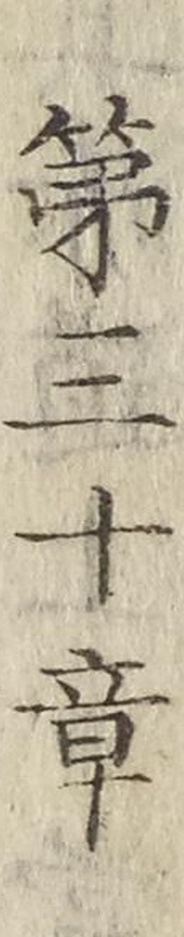第三十章
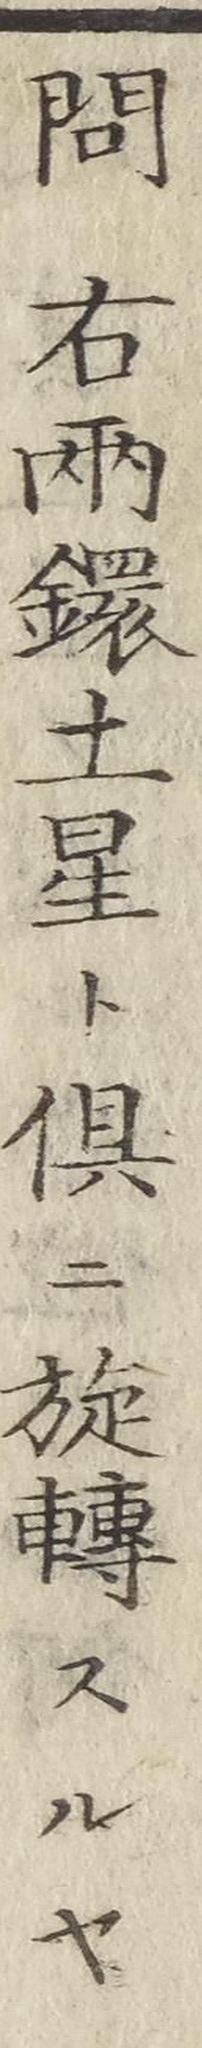問右両鐶土星ト倶ニ旋転スルヤ
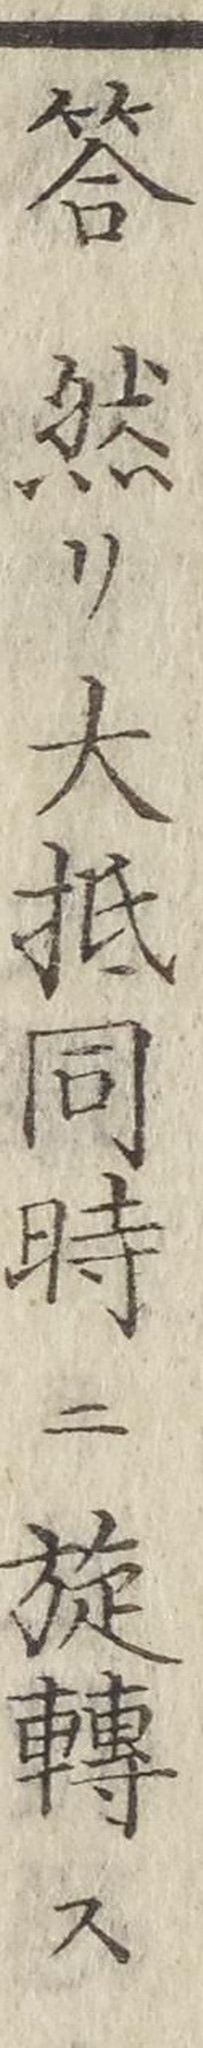答然リ大抵同時ニ旋転ス
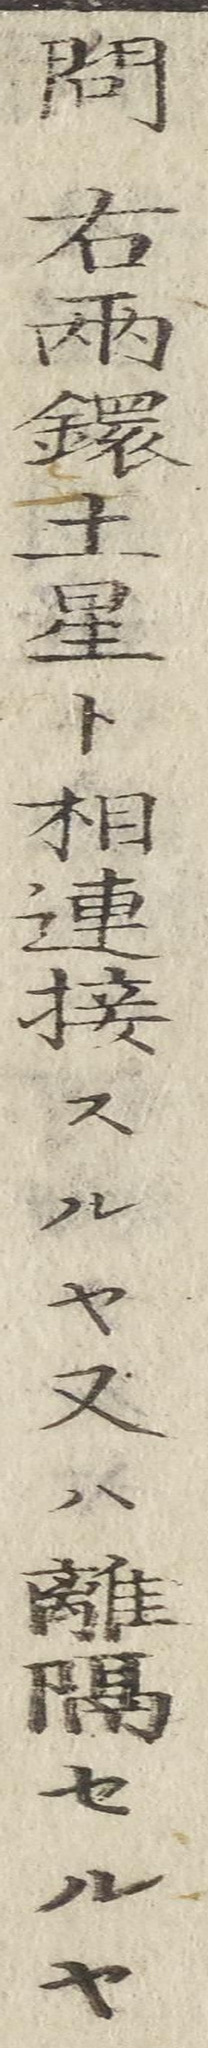問右両鐶王星ト相連接スルヤ又ハ離隔セルヤ
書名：星学圖説　下
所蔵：東京大学地震研究所図書室 Earthquake Research Institute Library, The University of Tokyo, JAPAN
